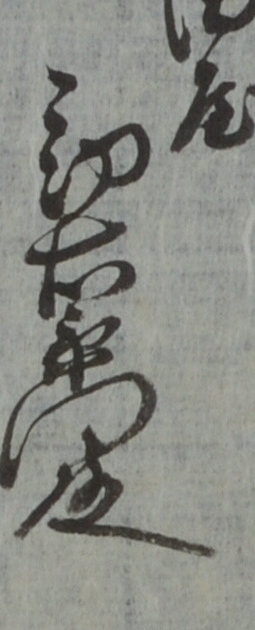勘右衛門殿

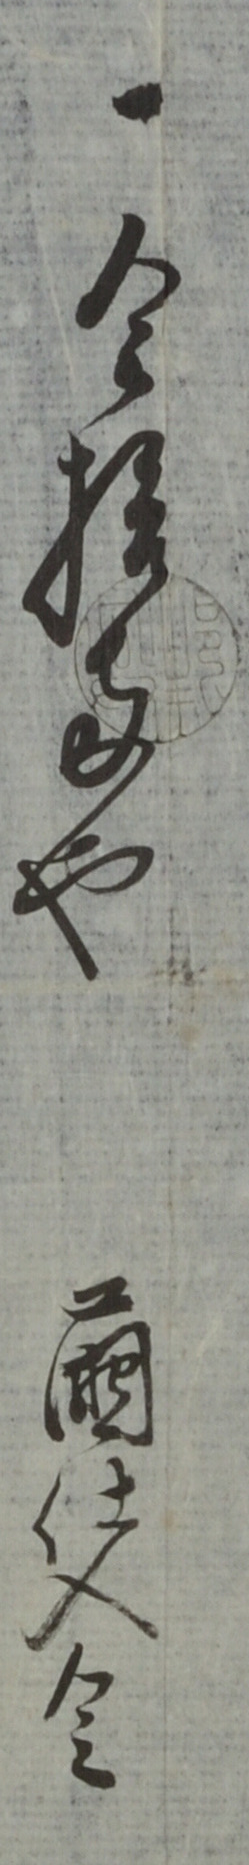一金拾両也繭仕入金
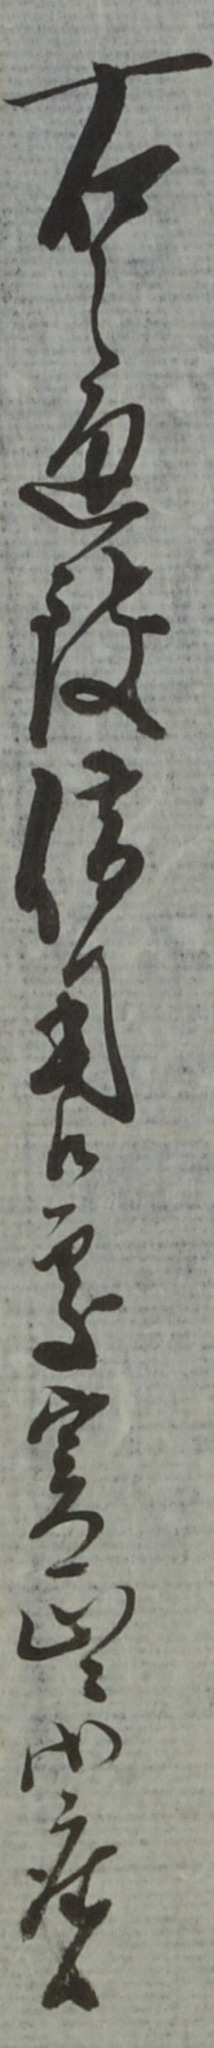右之通致借用候処実正ニ御座候
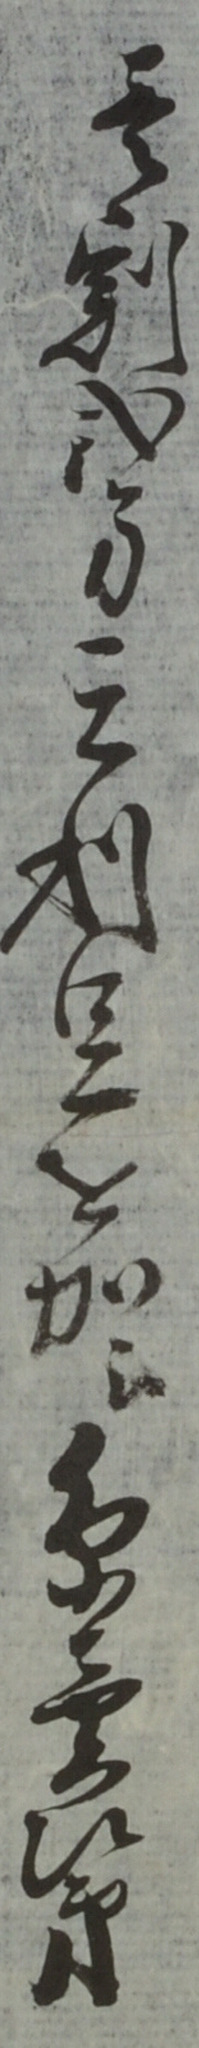壱割弐分之利足を加江糸売次第
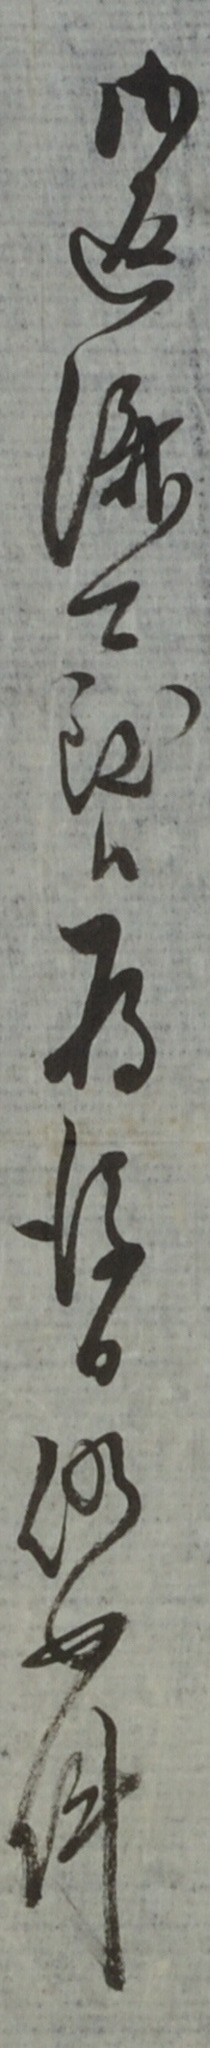御返済可致候為後日仍如件
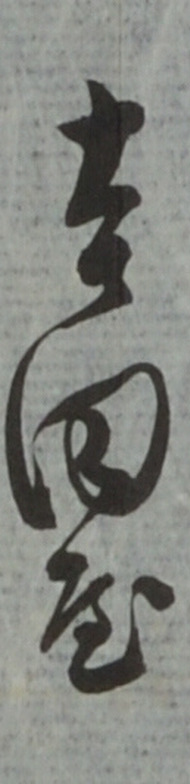吉田屋
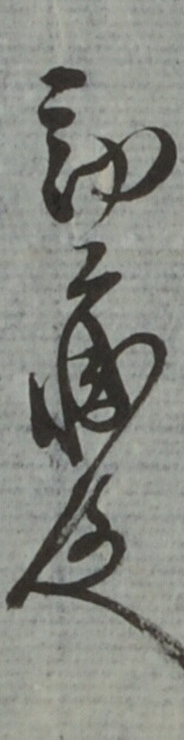勘蔵殿

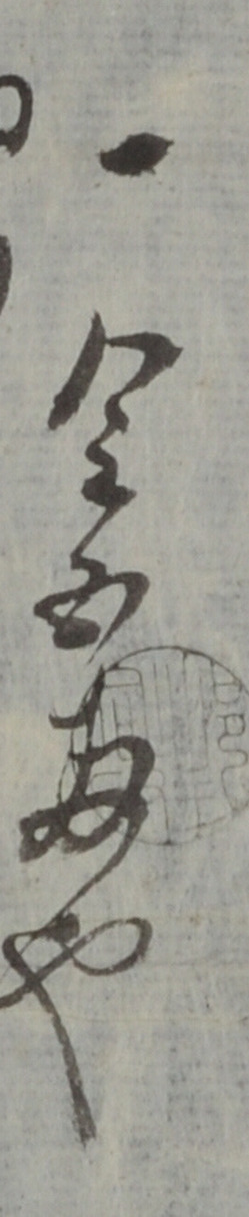一金五両也
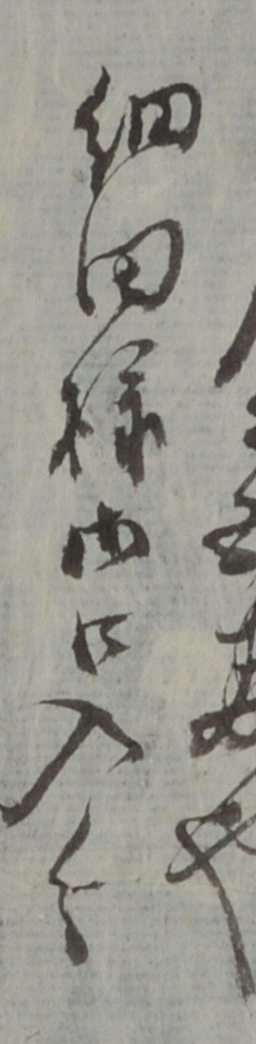細田様御口入分
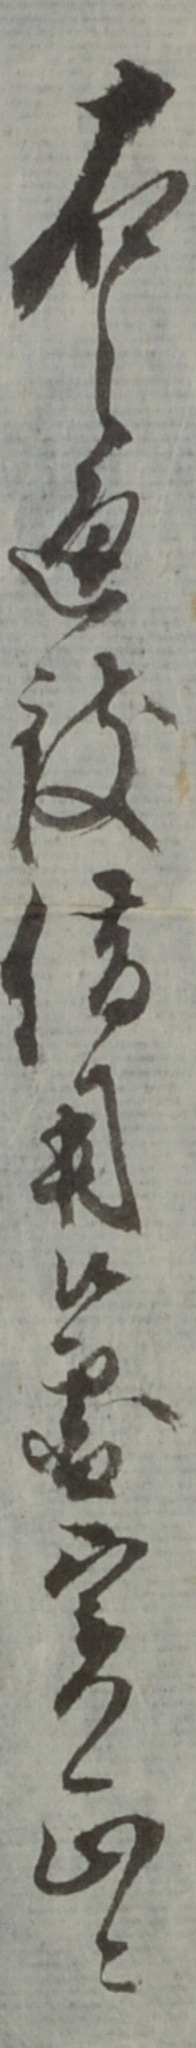右之通致借用候処実正ニ
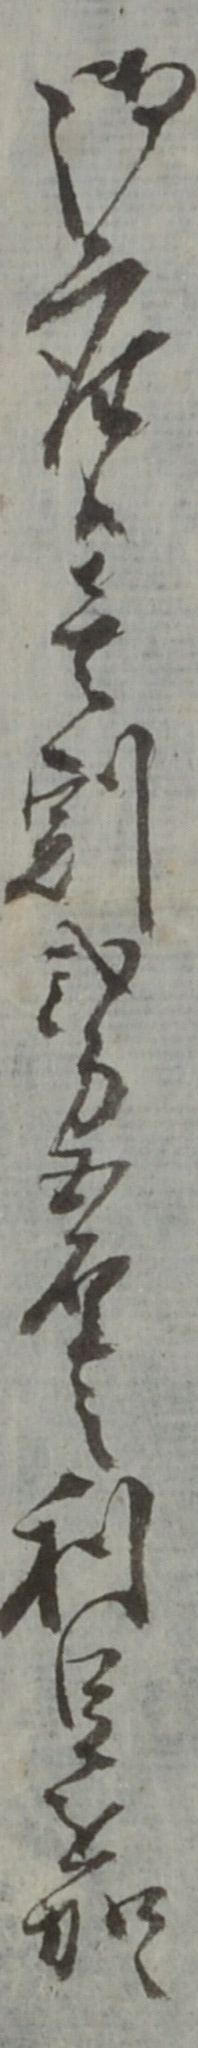御座候壱割弐分五厘之利足を加へ
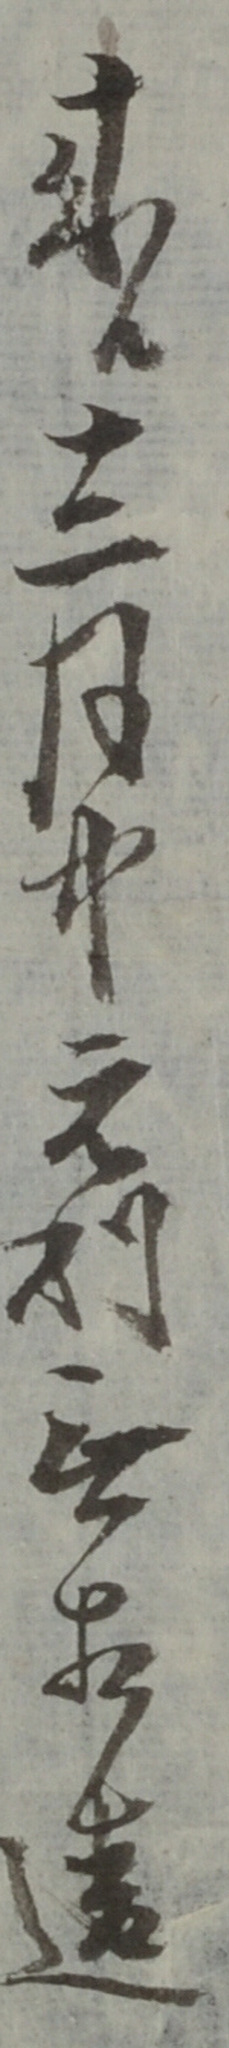来ル十二月中元利無相違
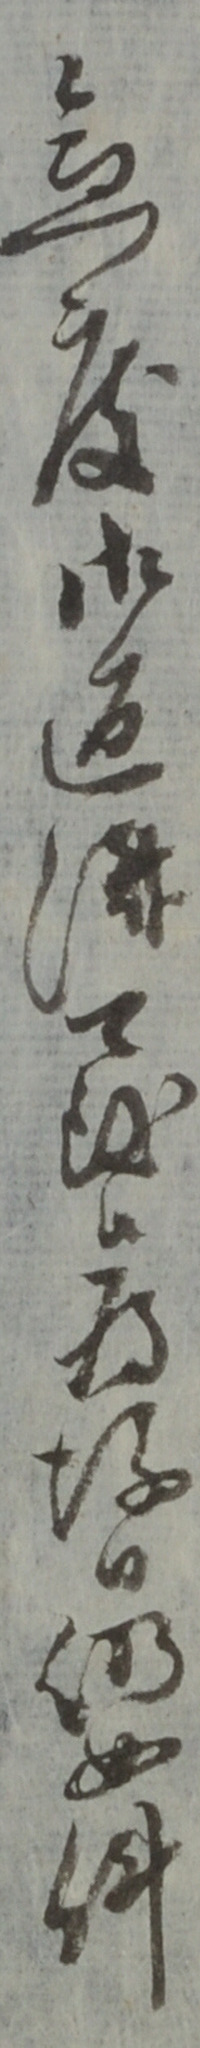急度御返済可致候為後日仍如件
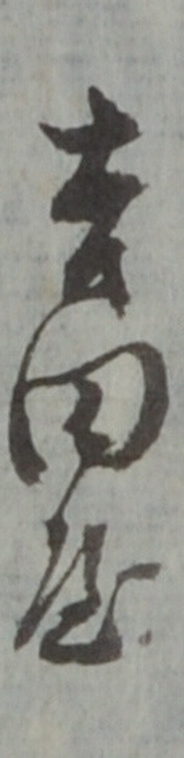吉田屋
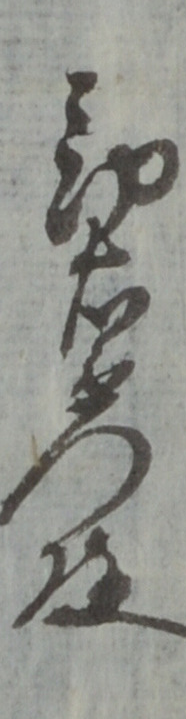勘右衛門殿
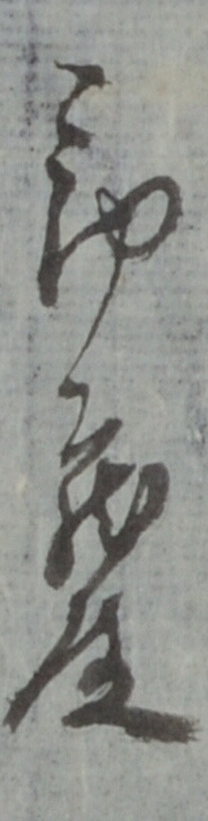勘蔵殿
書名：拝借證文之事
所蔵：伊那市立高遠町図書館・合同会社AMANE
